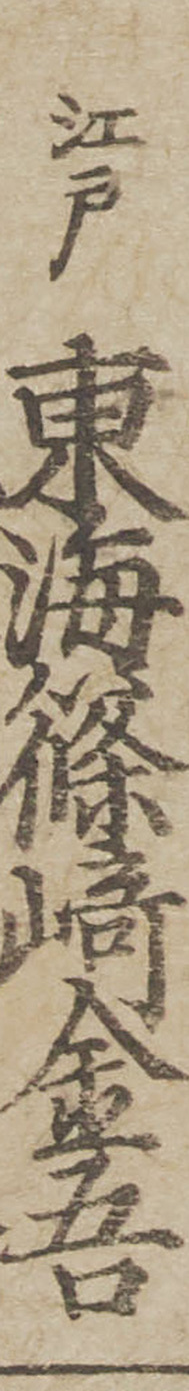同江戸東海篠崎金吾
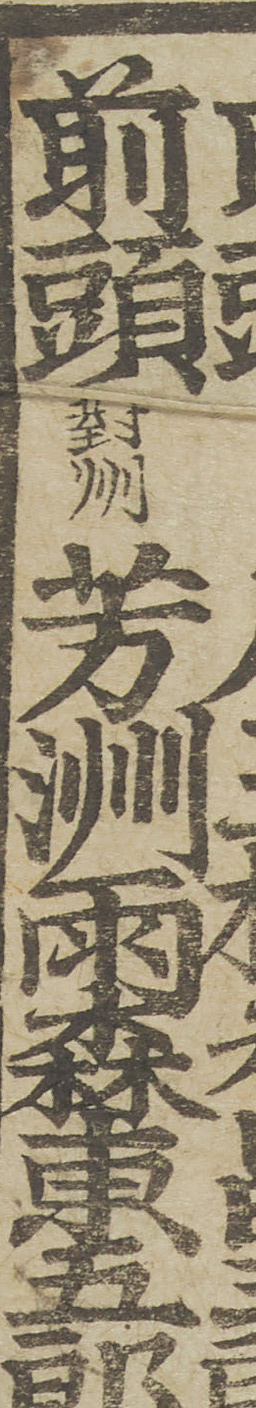前頭對州芳洲雨森東五郎
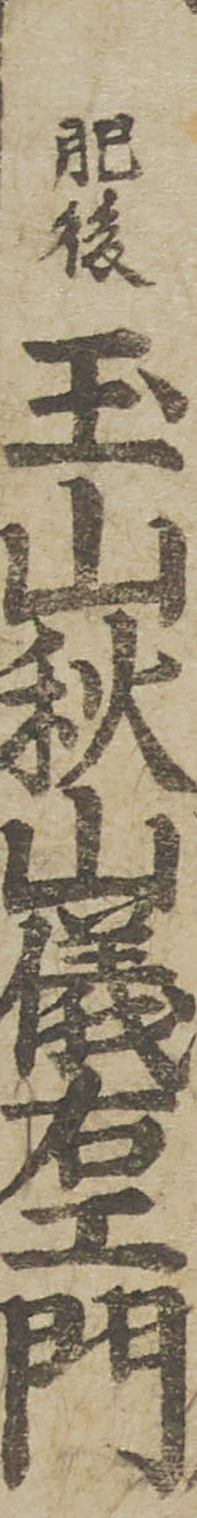同肥後玉山秋山儀右エ門
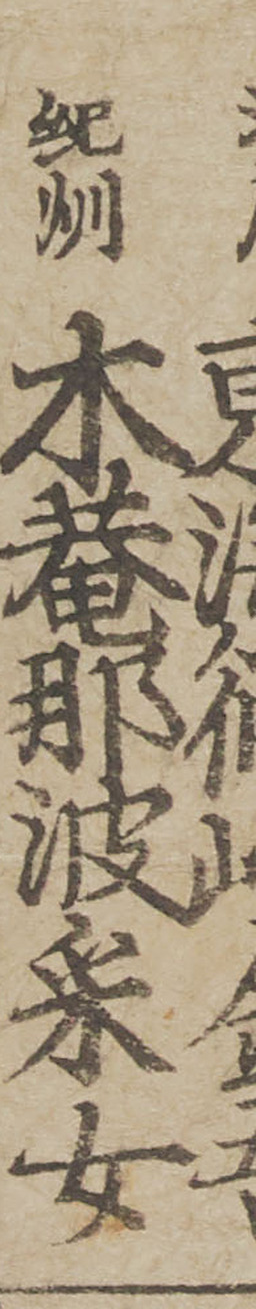同紀州木菴那波采女
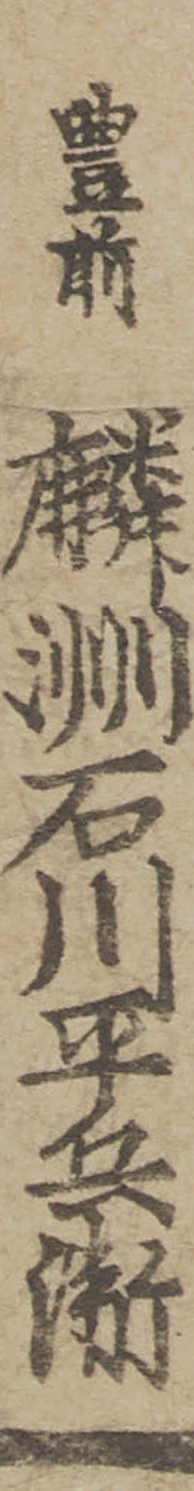同豊前麟洲石川平兵衛
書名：儒者競
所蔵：東京大学総合図書館 General Library in the University of Tokyo, JAPAN
